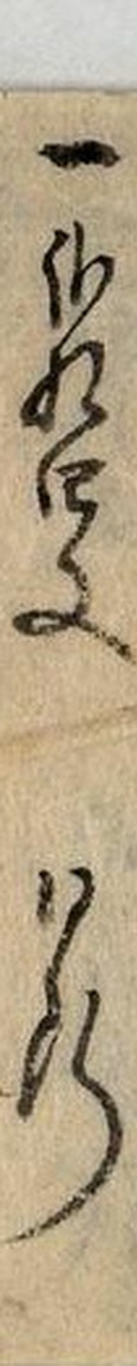一弐拾四文同断
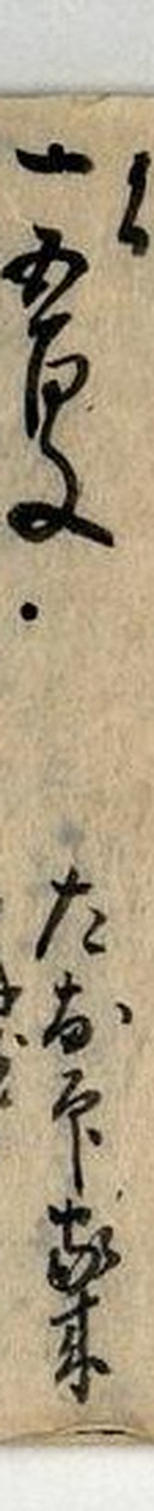一五百文たな印家来
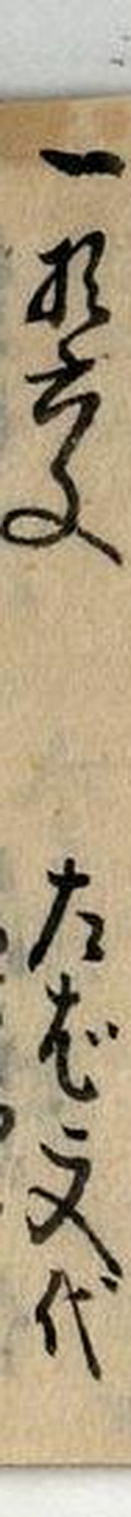一拾六文たばこ〆代
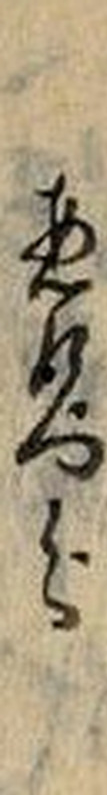惣左衛門分
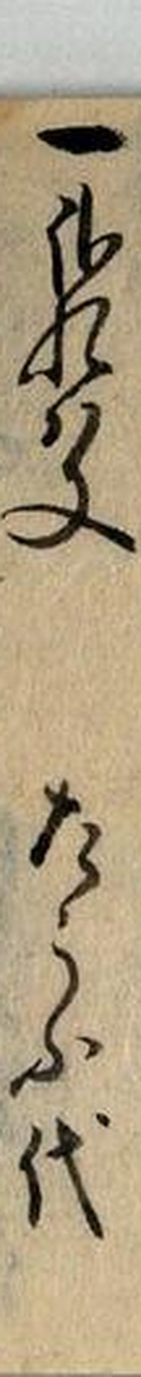一弐拾八文たうふ代
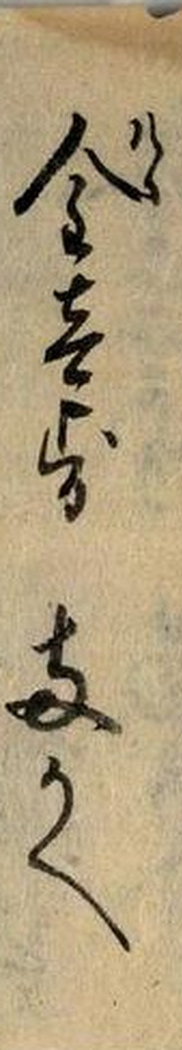金壱歩両かへ
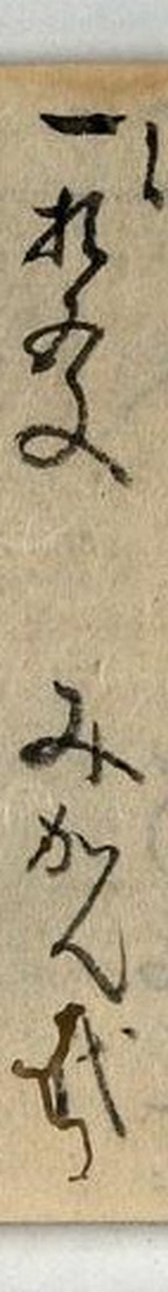一拾五文みかん代
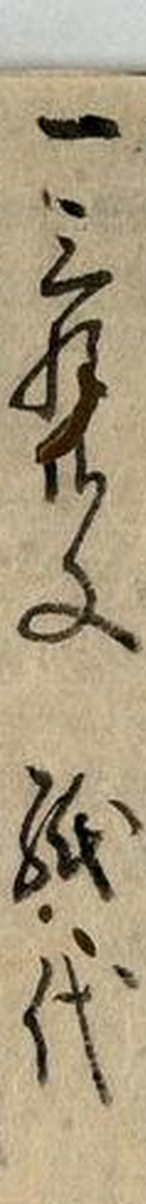一三拾弐文紙代
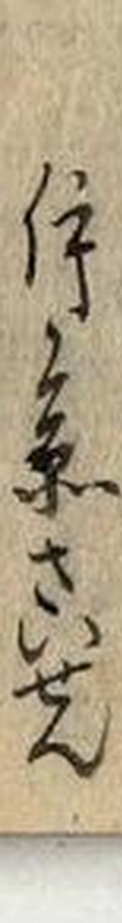伊兵衛さいせん
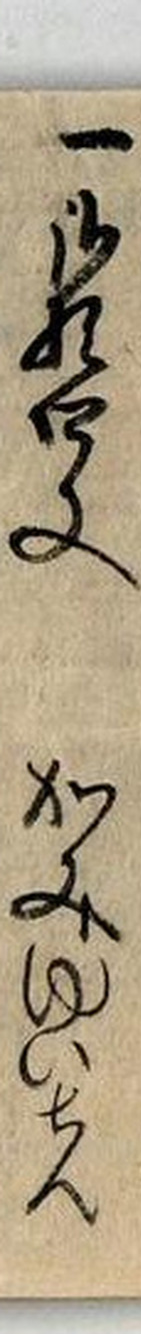一弐拾四文かみゆいちん
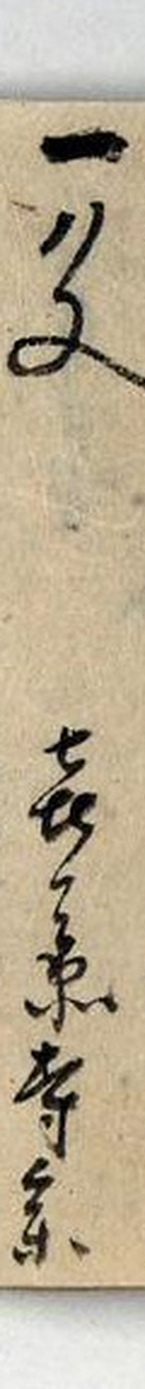一八文喜兵衛寺参
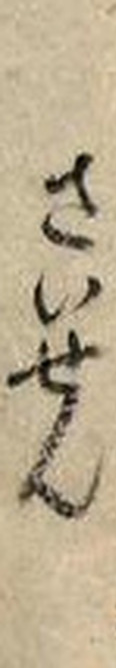さいせん

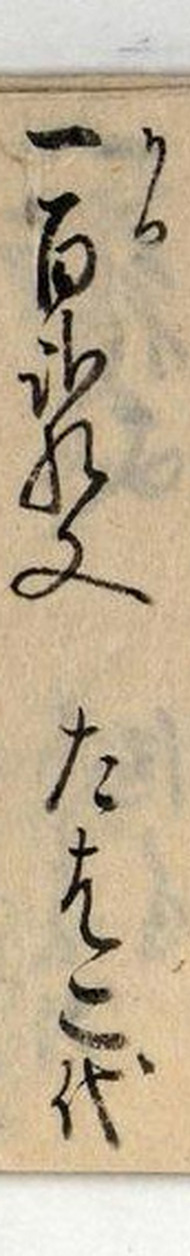一百二十文たはこ代
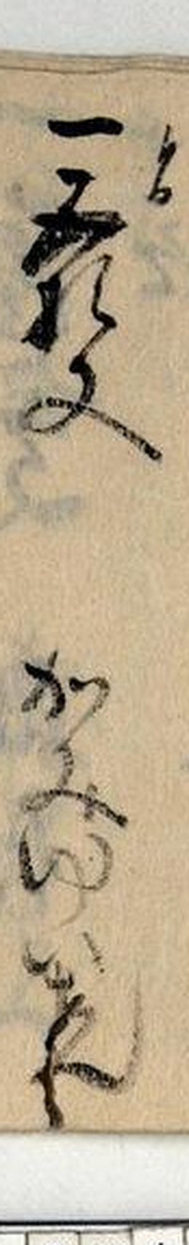一五十文かみゆいちん
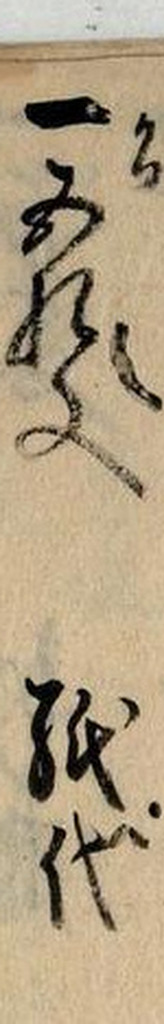一五十文紙代
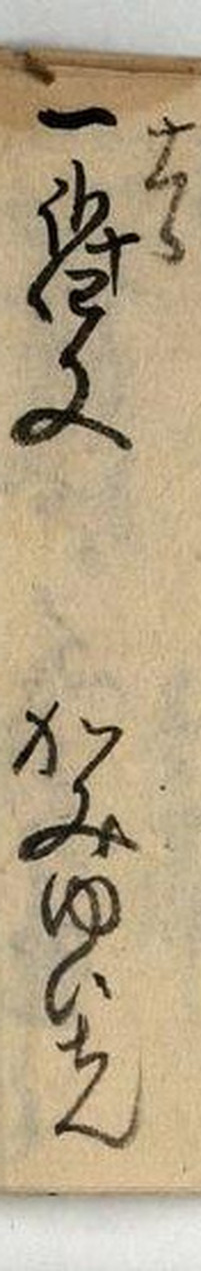一二十四文かみゆいちん
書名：道中小遣留帳（旅）
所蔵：福井県文書館 Fukui Prefectural Archives
